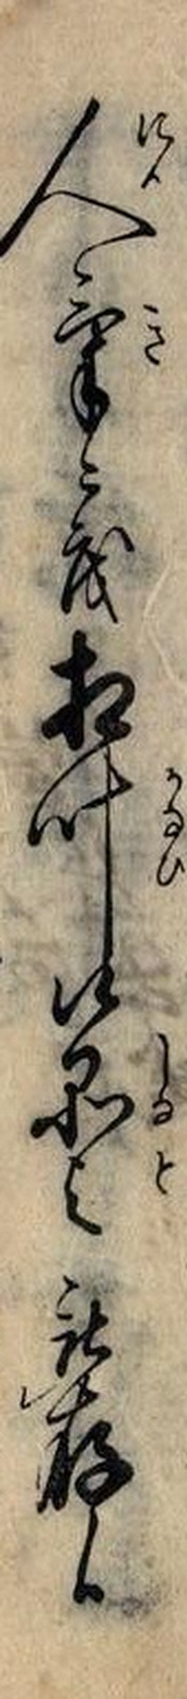人気にも相叶候品与被存候
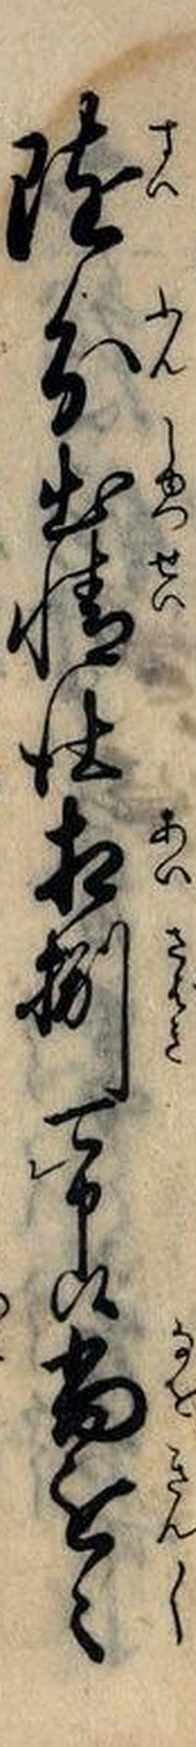随分出情仕相捌可申候尚近々
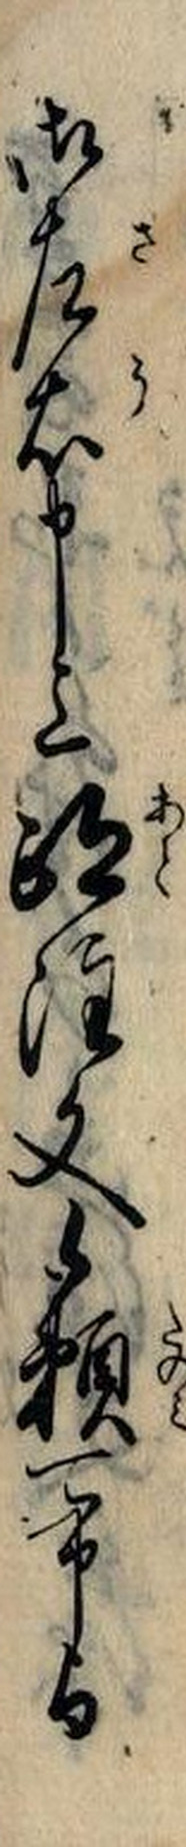御左右申上跡注文御頼可申与
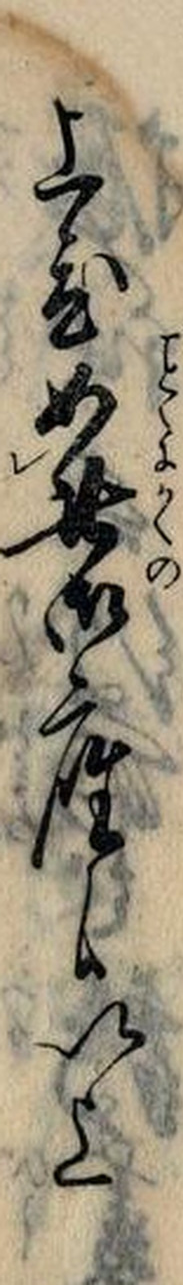上度如此御座候以上
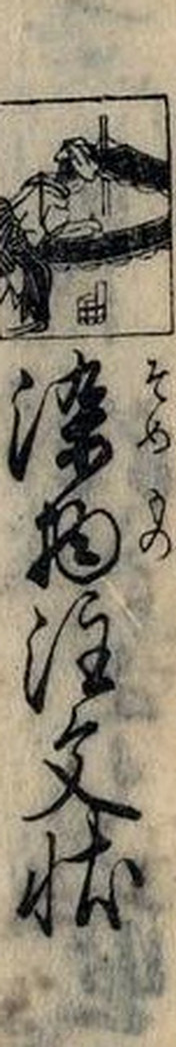染物注文状
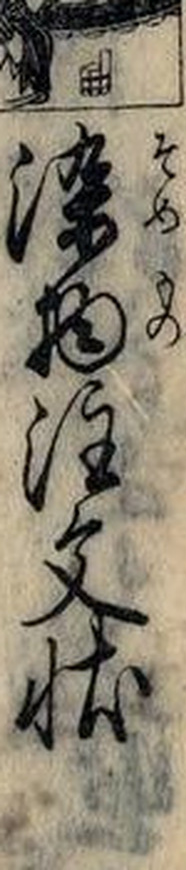染物注文状
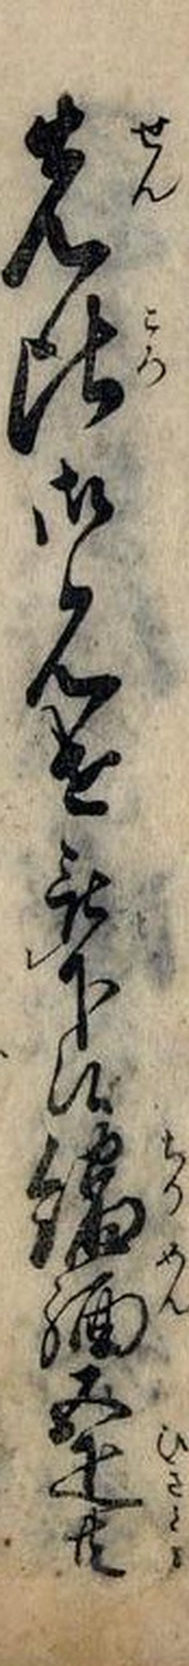先比御見せ被下候縮緬五疋共
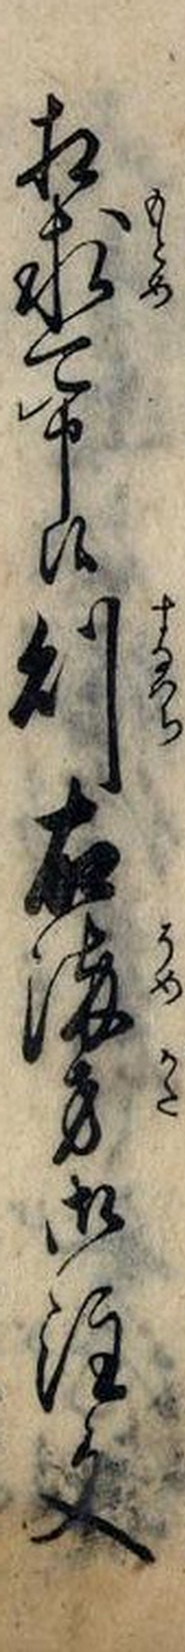相求可申候則右染方御注文
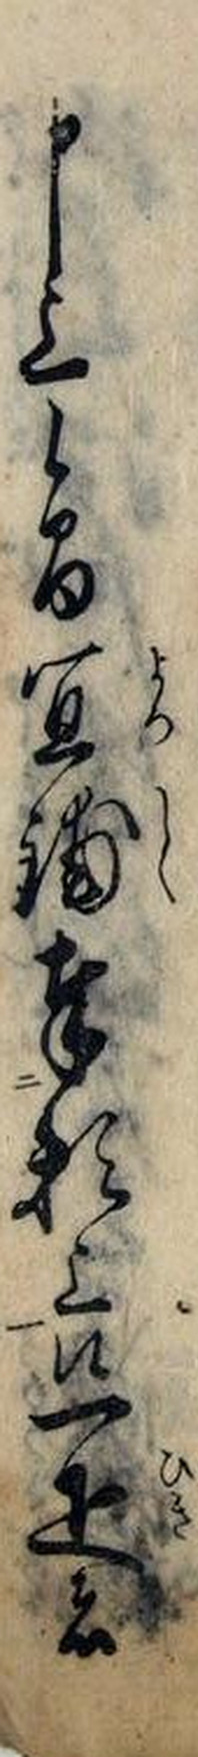申上候間宜鋪奉頼上候一疋者

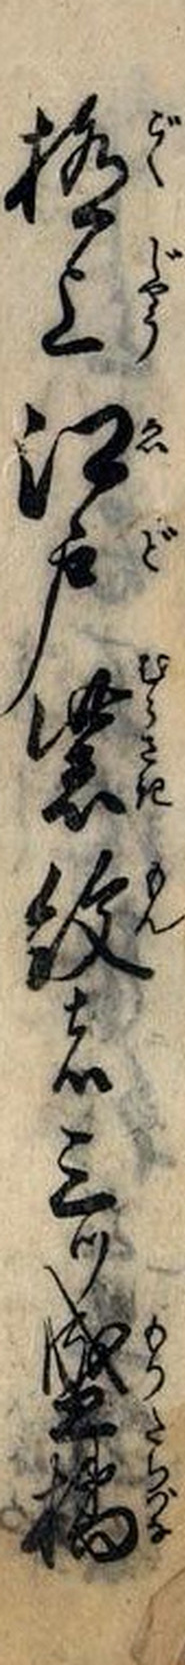極上江戸紫紋者三ッ盛橘
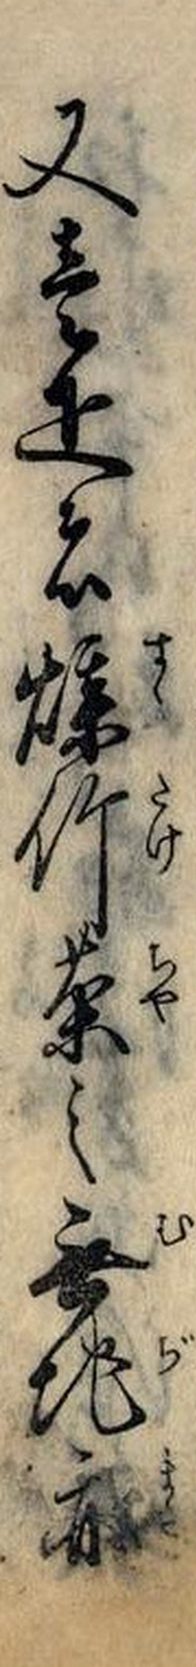又壱疋者煤竹茶之無地亦
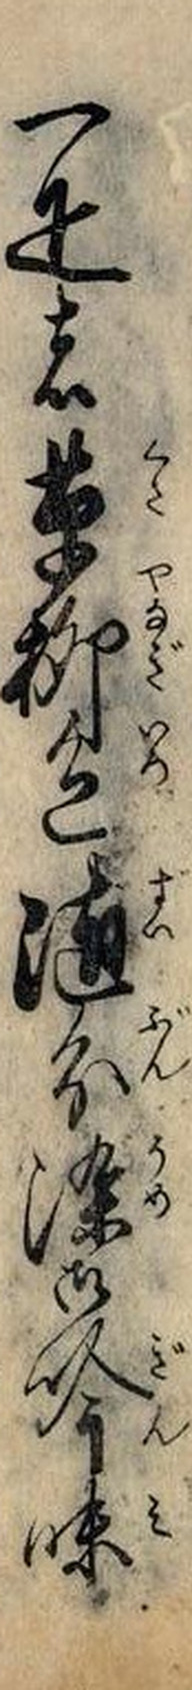一疋者草柳色随分染御吟味
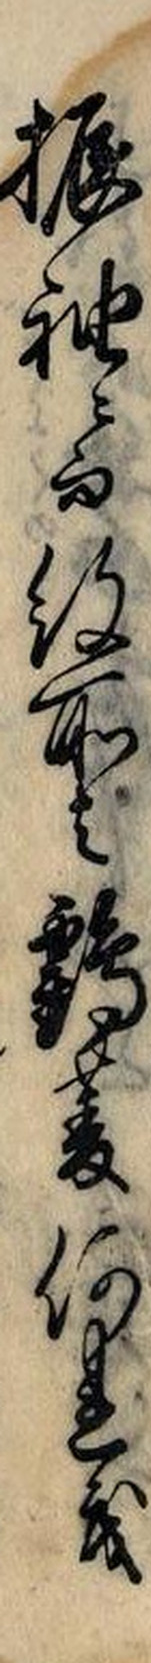振袖に而紋所者鶴菱何れも
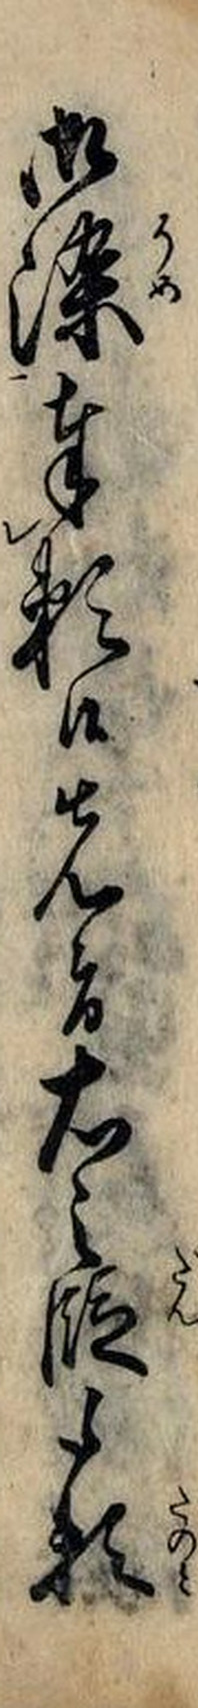御染奉頼候先者右之段御頼
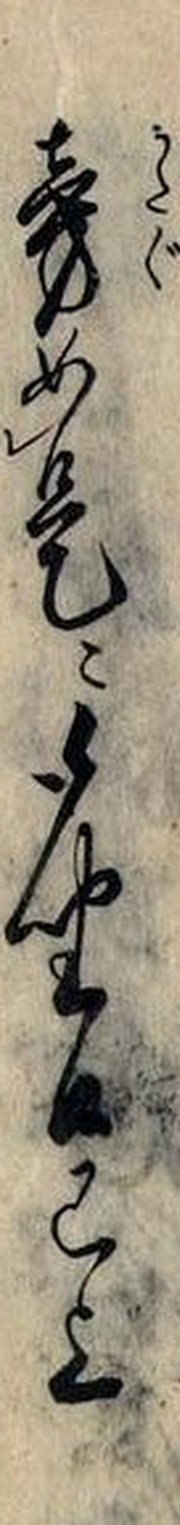旁如是に御座候已上
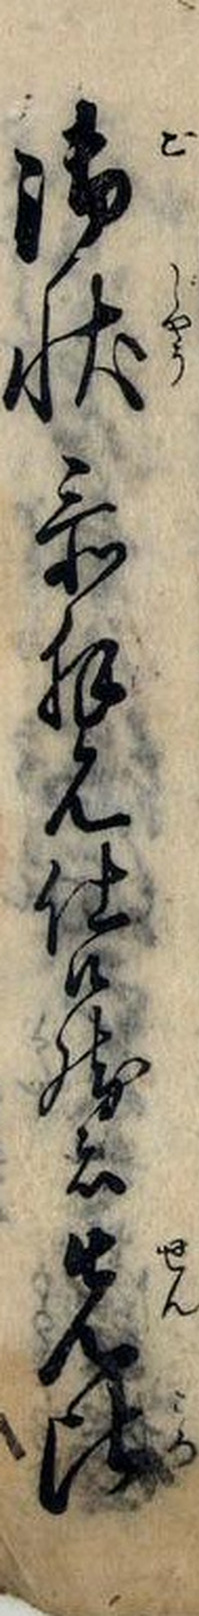御状忝拝見仕候然者先比
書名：大成用文章（往来物）
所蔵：福井県文書館 Fukui Prefectural Archives
